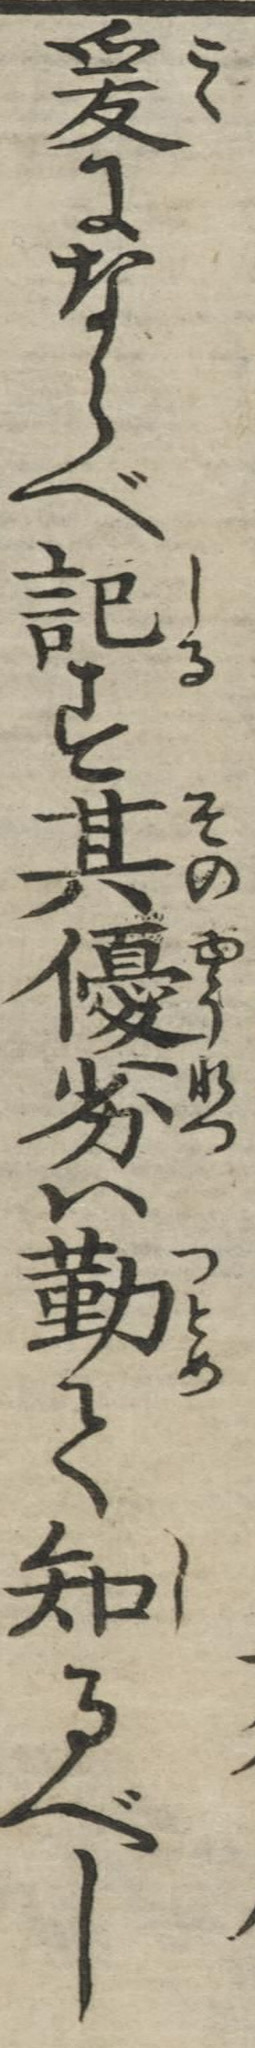爰にならべ記す其優劣は勤て知るべし
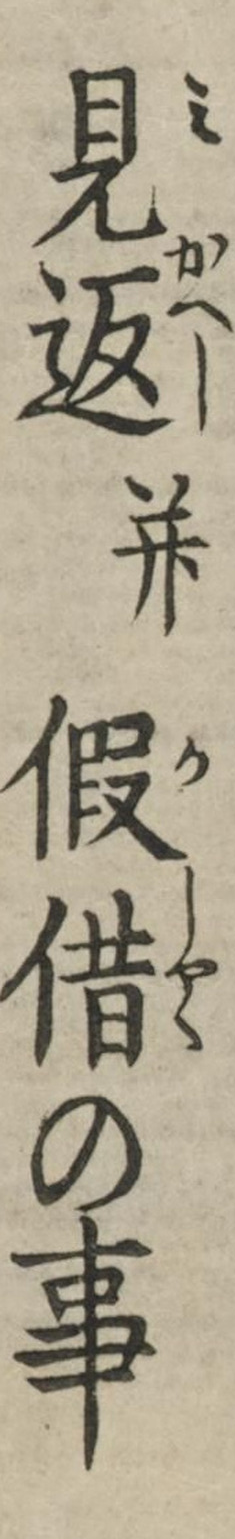見返并仮借の事
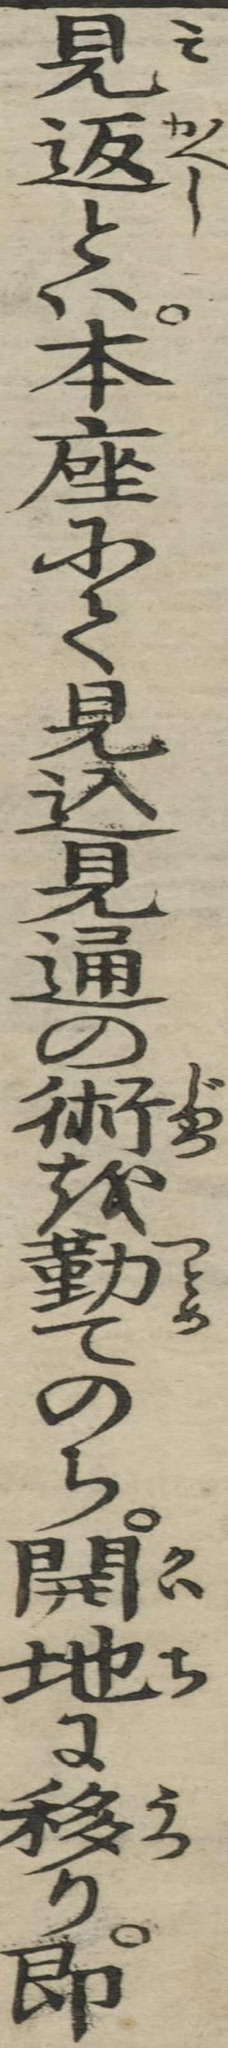見返とは。本座にて見込見通の術を勤てのち。開地に移り。即
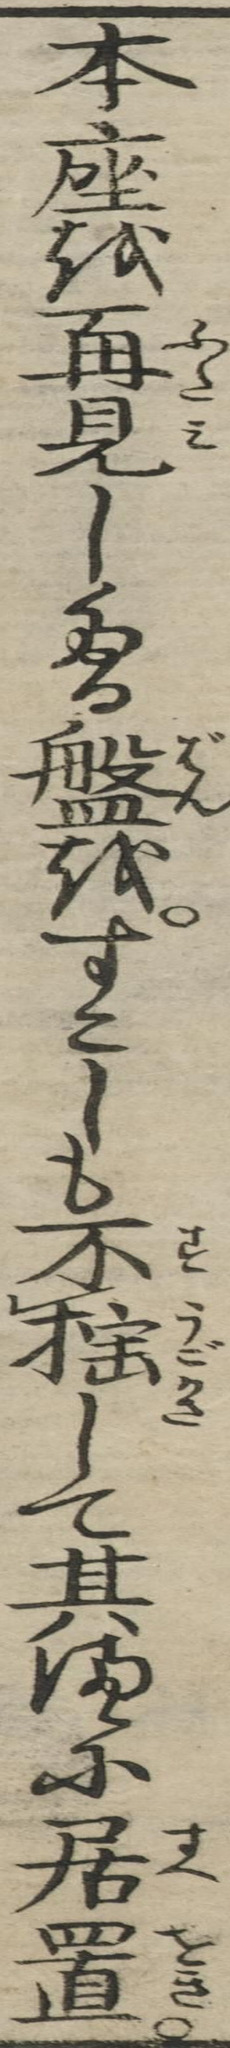本座を再見したる盤を。すこしも不揺して其まゝに居置。
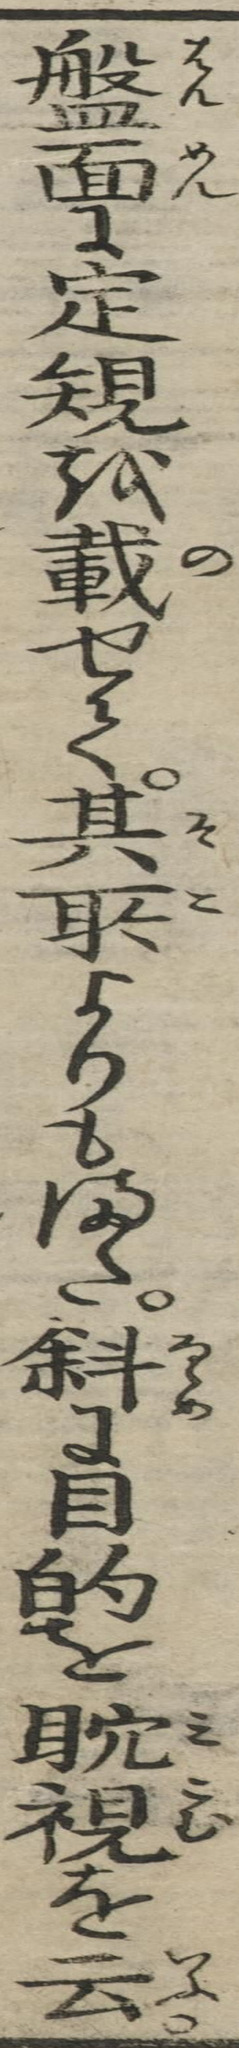盤面に定規を載せて。其所よりもまた。斜に目的を睨視を云。

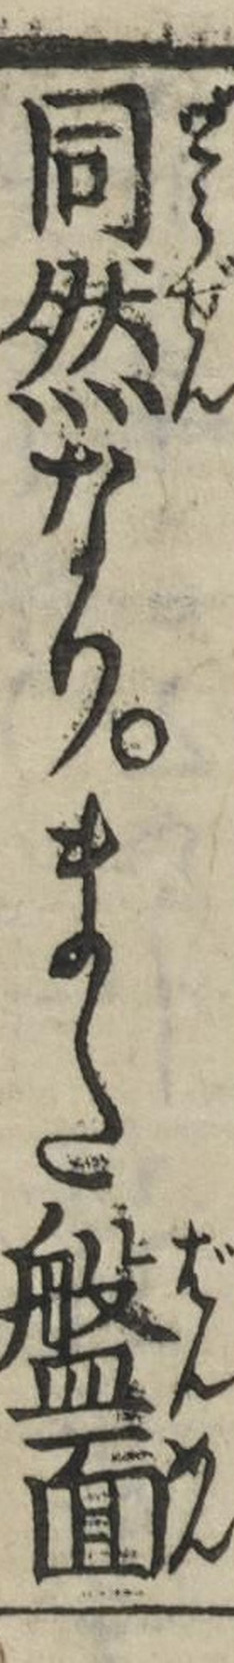同然なり。また盤面
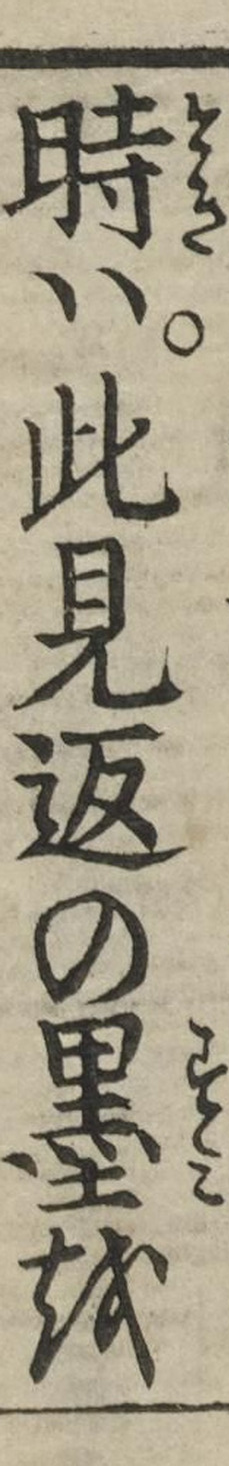時は。此見返の墨を
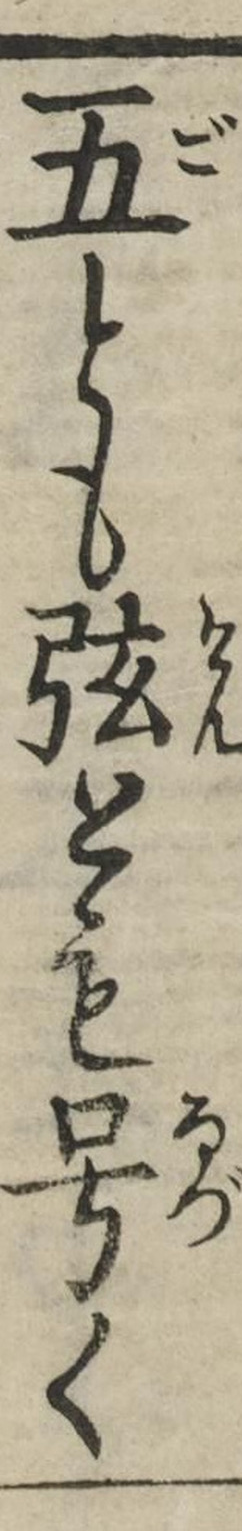五とも弦とも号く
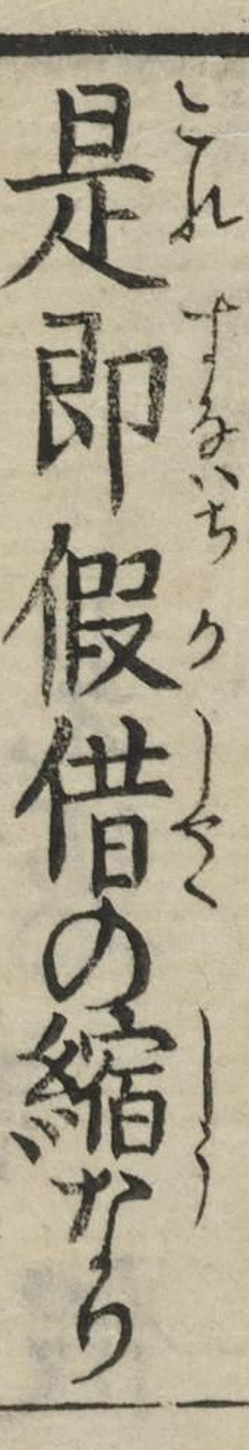是即仮借の縮なり
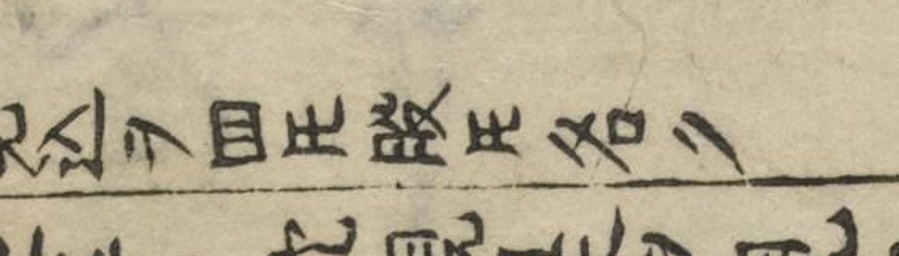此見込ヲ四トモ股トモ名ク
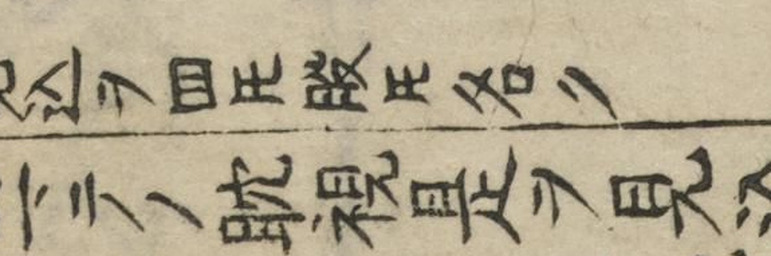此見込ヲ四トモ股トモ名ク
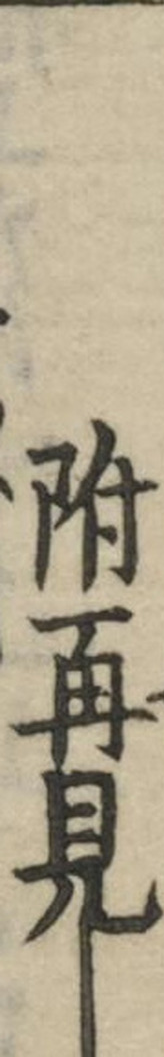附再見
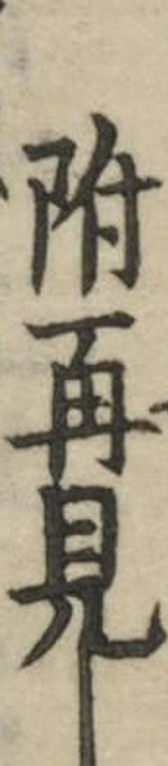附再見
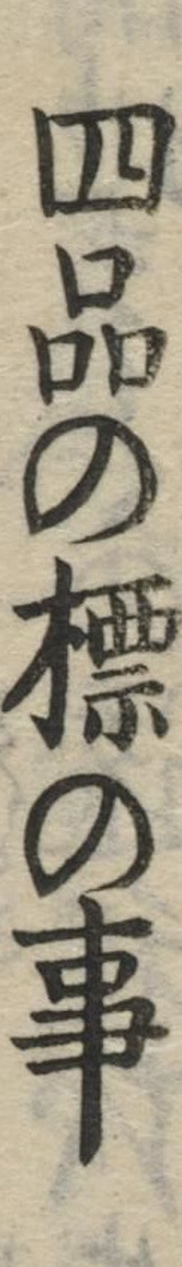四品の標の事
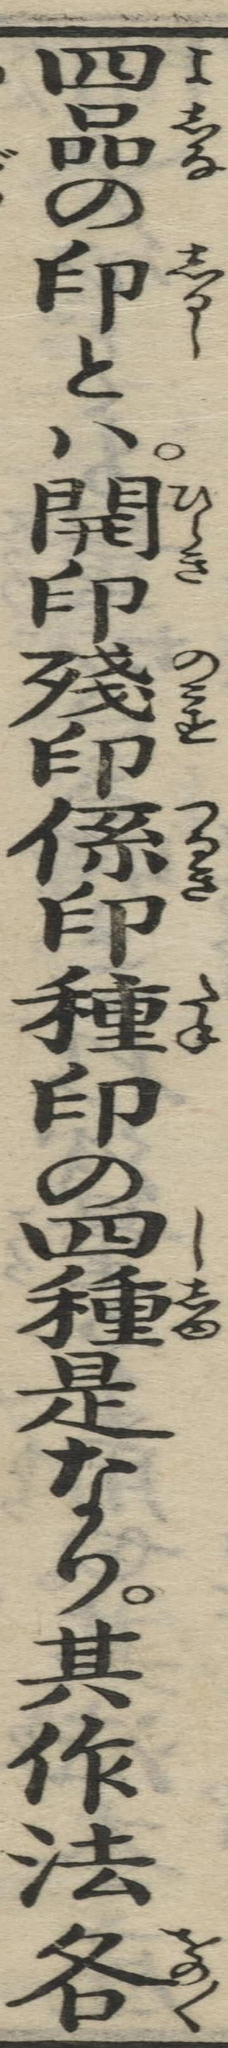四品の印とは。開印残印係印種印の四種なり。其作法各
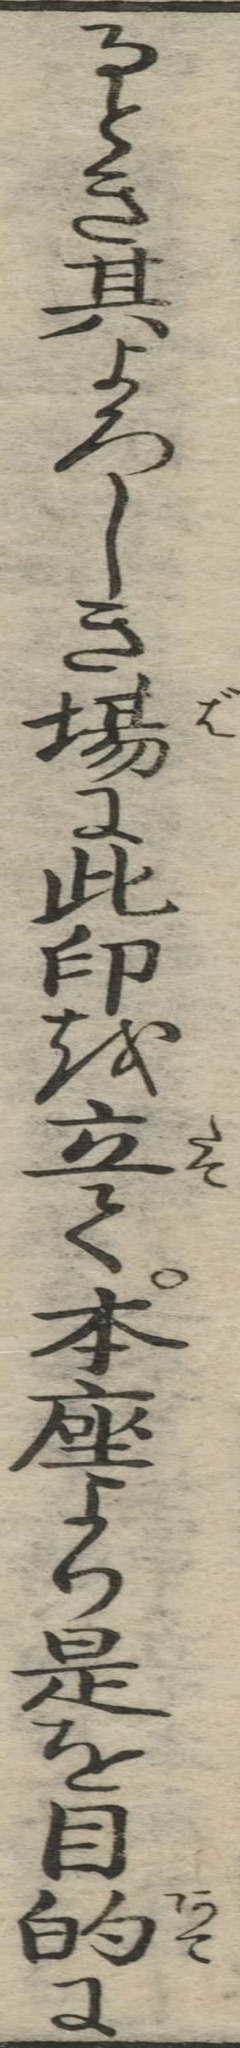るとき其よろしき場に此印を立て。本座より是を目的に
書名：量地指南　巻之一（内題）
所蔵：東京大学地震研究所図書室 Earthquake Research Institute Library, The University of Tokyo, JAPAN
